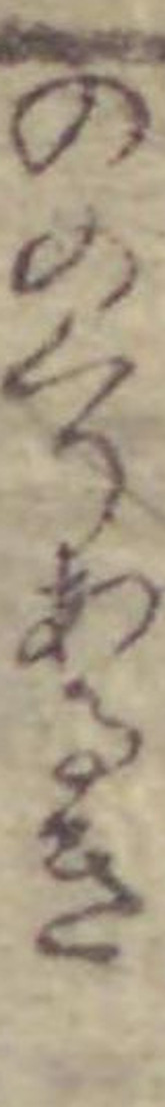ののくりあるき
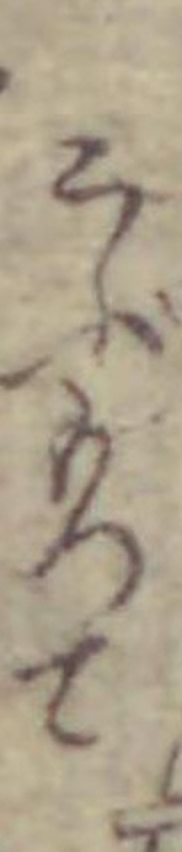こふもつて
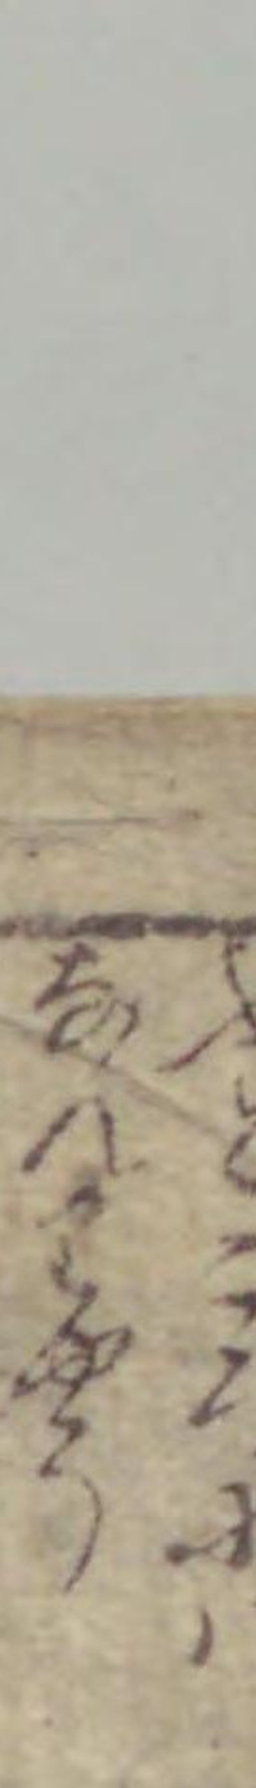なんりやう
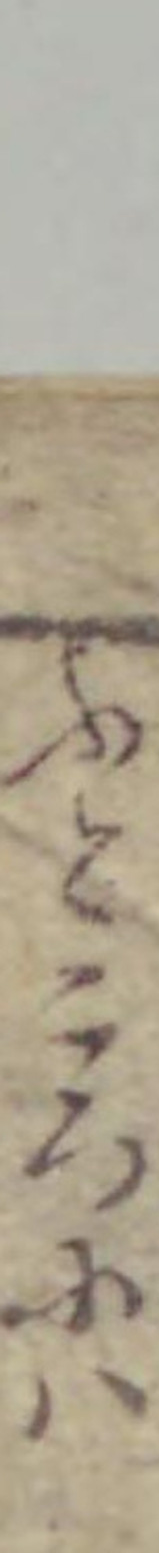ふところには
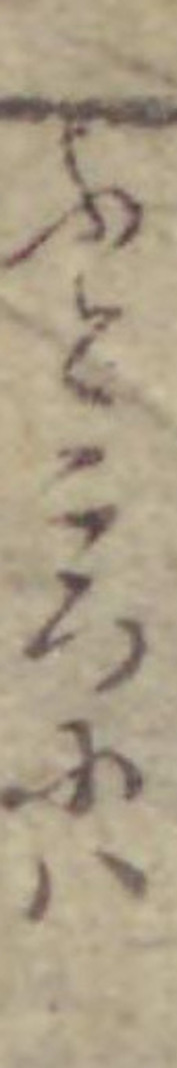ふところには
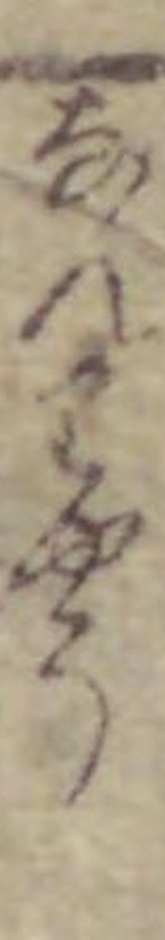なんりやう
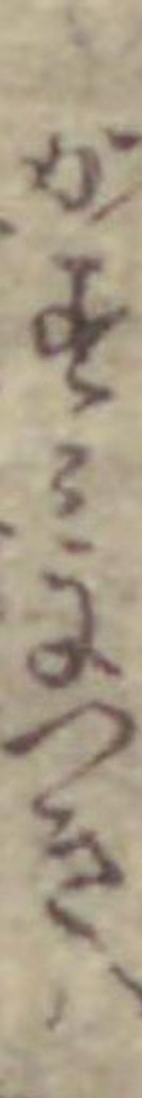かすみにつきは
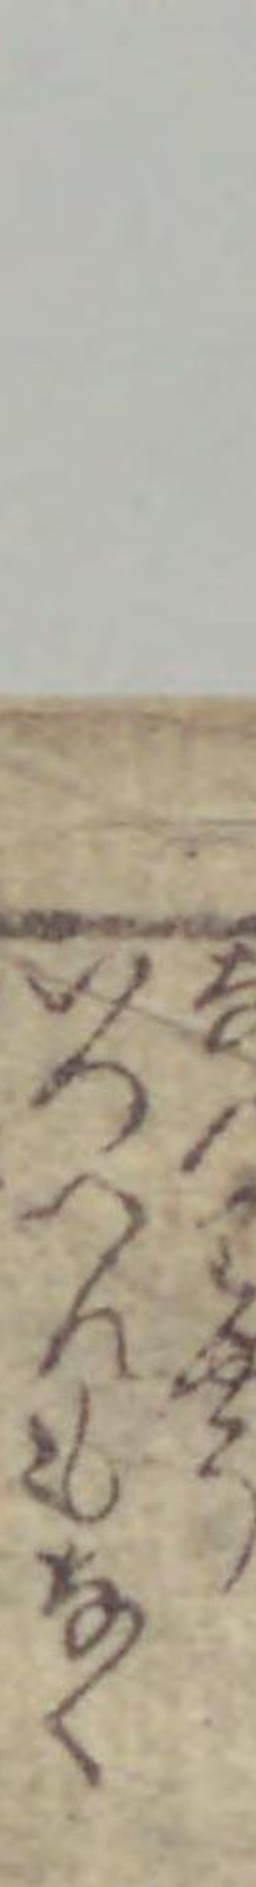いつへんもなく
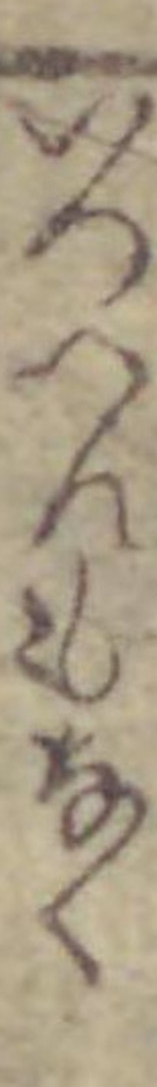いつへんもなく
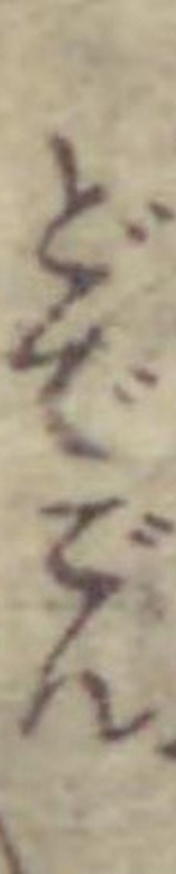どでごん
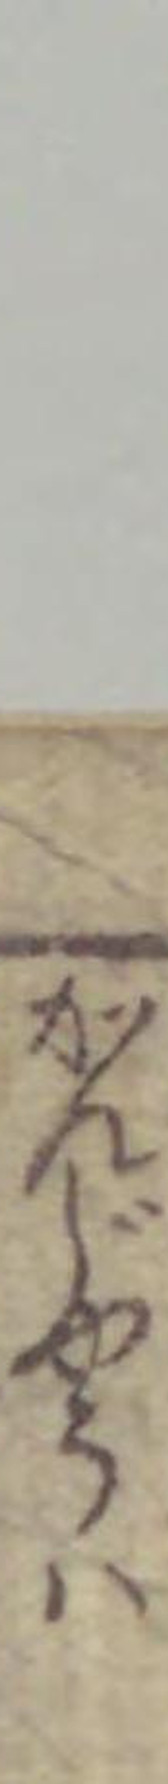かんじやうは
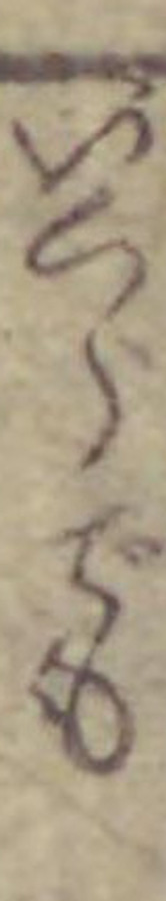いくらでも
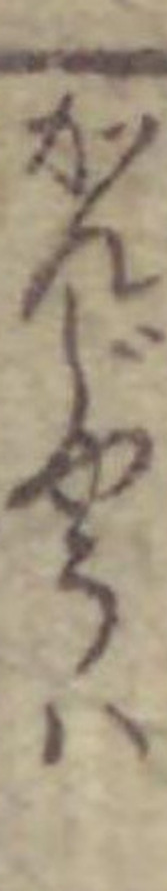かんじやうは
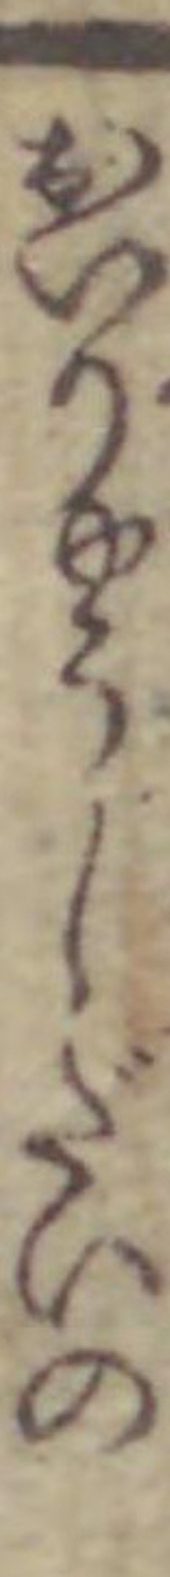おいりやうしだいの
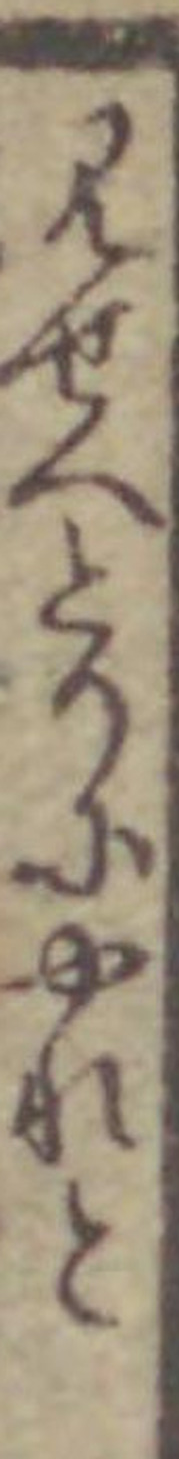見せへとりにやれと
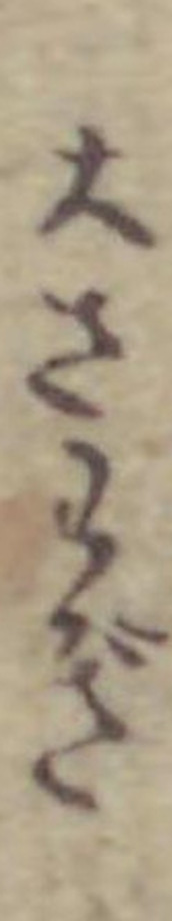大さわぎ
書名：親父布子鳶握 3巻
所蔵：国立国会図書館 National Diet Library, JAPAN
